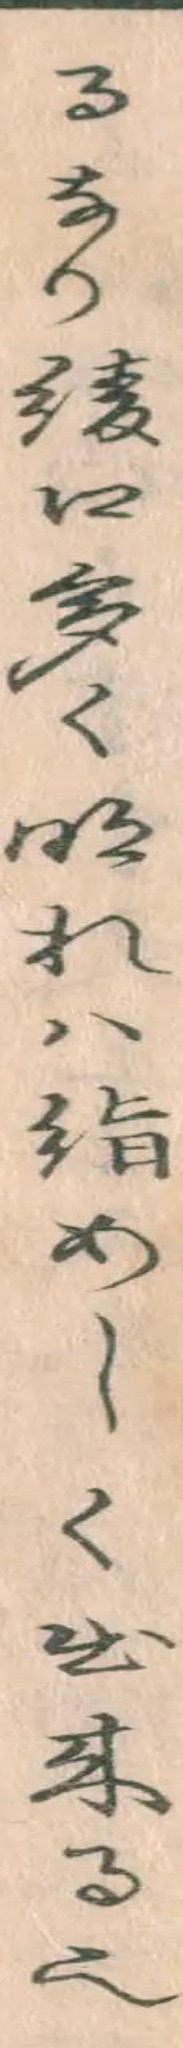るなり綾口多く明れは𥿻あしく出来る也
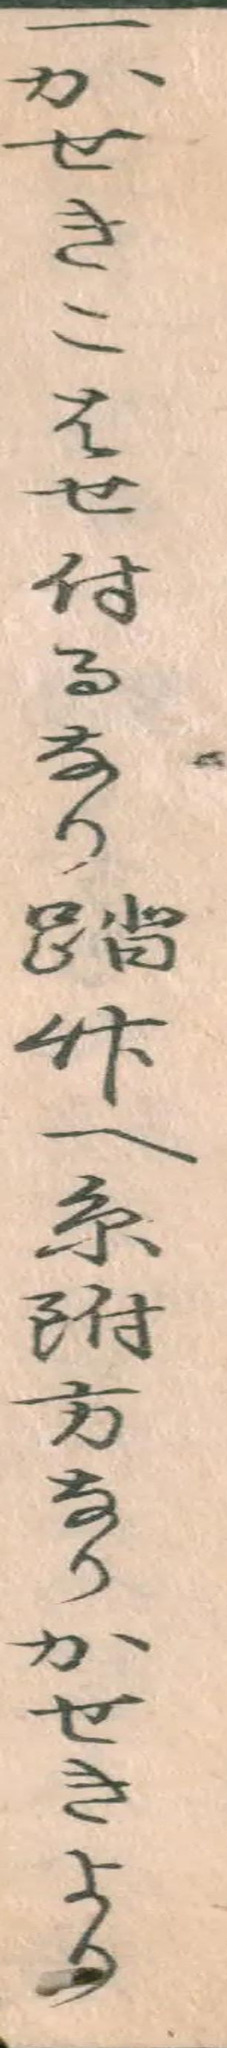一かせきこはせ付るなり蹈竹へ糸附方なりかせきより
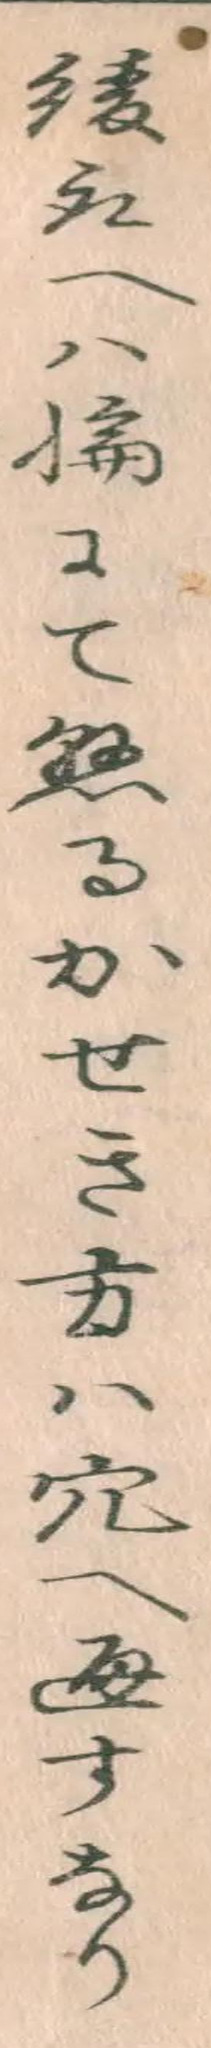綾取へは輪にて懸るかせき方は穴へ通すなり
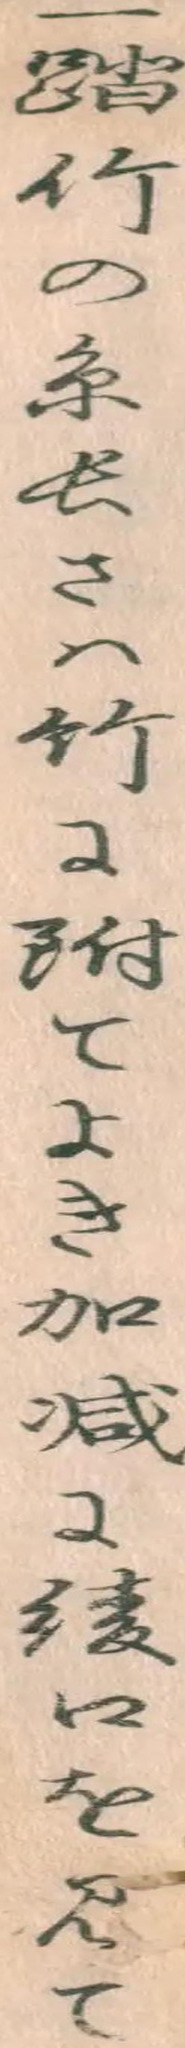一蹈竹の糸長さは竹に附てよき加減に綾口を見て
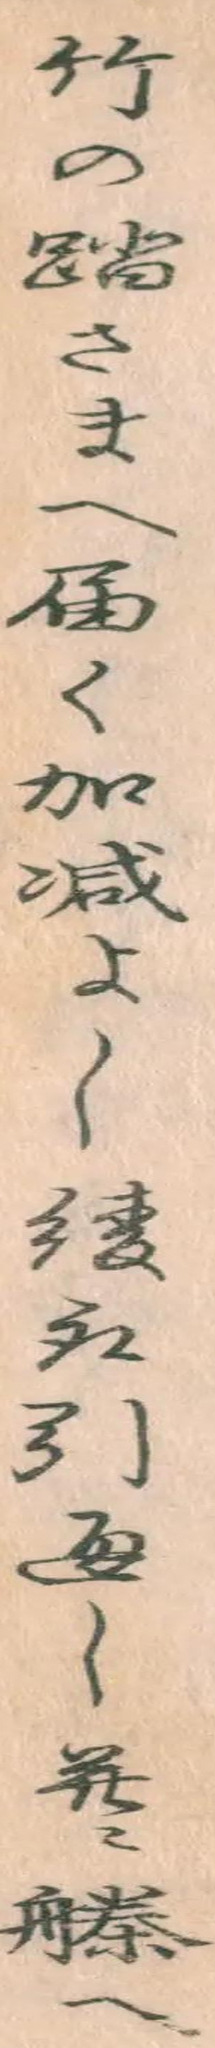竹の蹈さまへ届く加減よし綾取引通し幷に𣚗へ
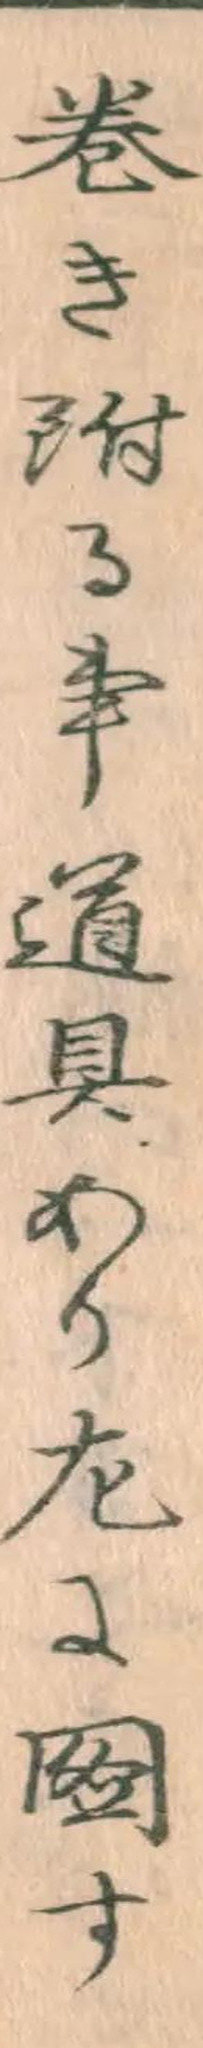巻き附る事道具あり左に図す
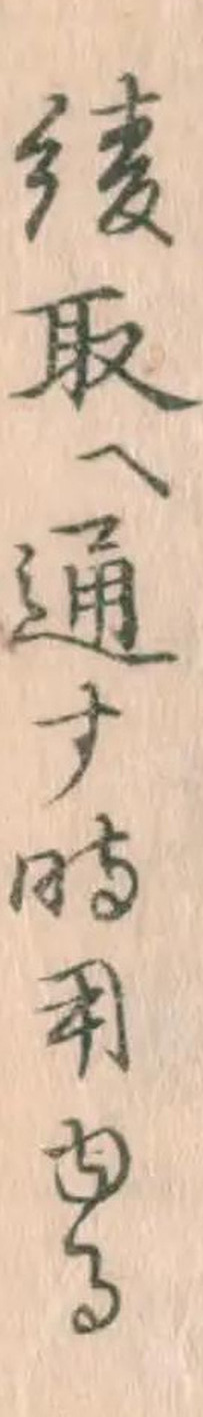綾取へ通す時用ゆる
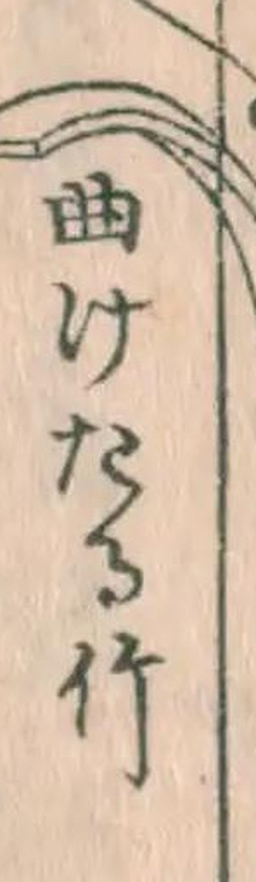曲けたる竹
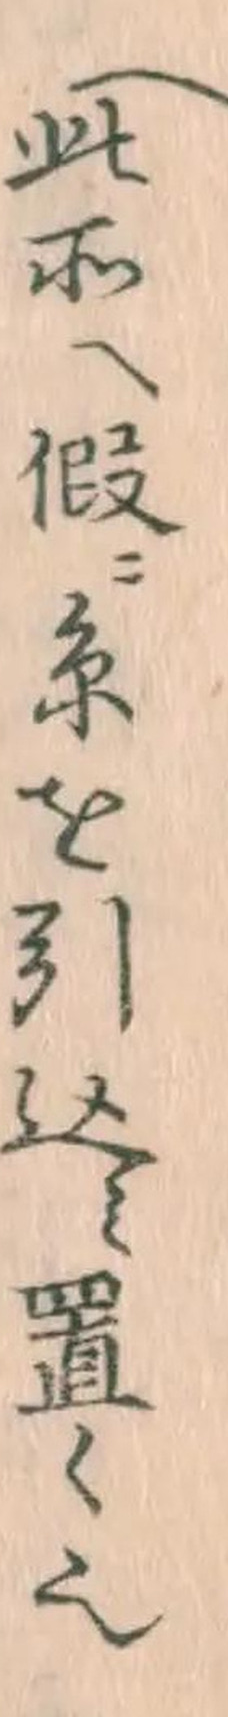此所へ仮に糸を引込み置く也
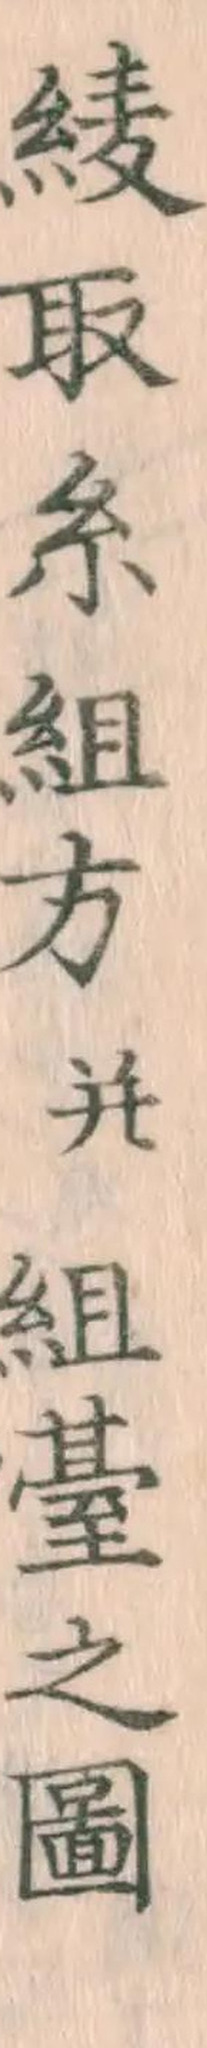綾取糸組方幷組台之図
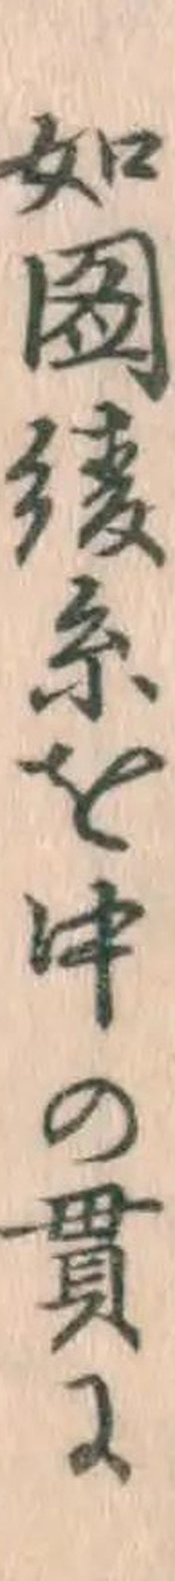如図綾糸を中の貫に
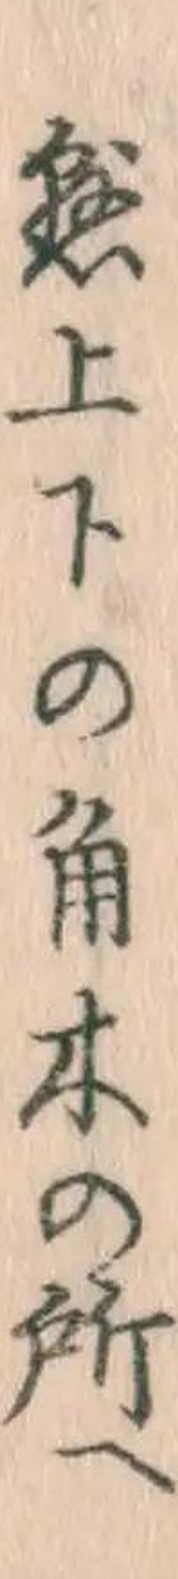懸上下の角木の所へ
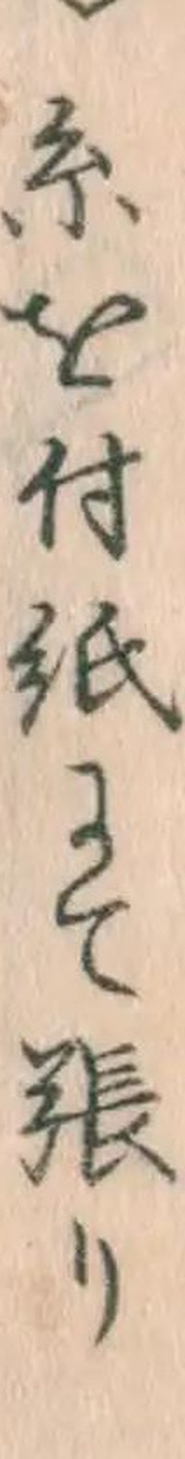糸を付紙にて張り
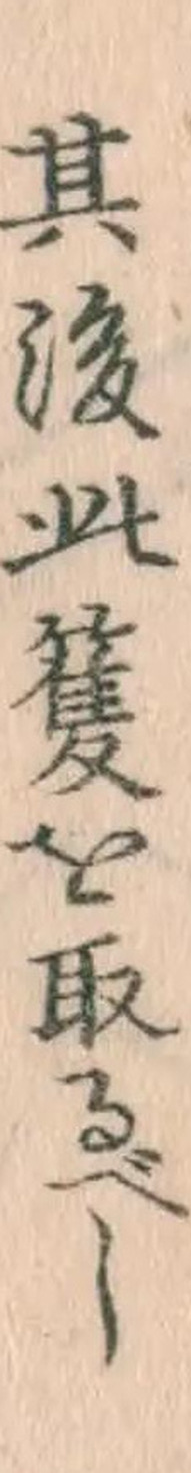其後此篗を取るべし
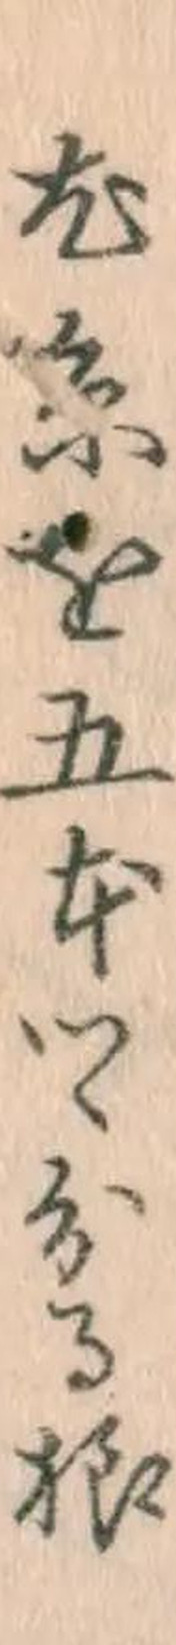尤糸を五本つゝ分る様
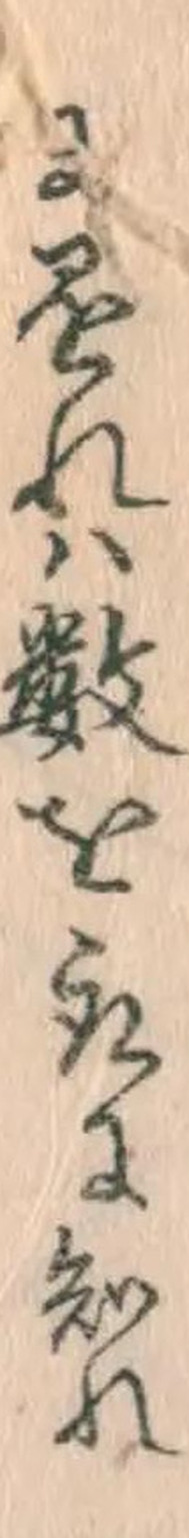に懸れは数を取に知れ
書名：機織彙編 5巻. [2]
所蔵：国立国会図書館 National Diet Library, JAPAN
